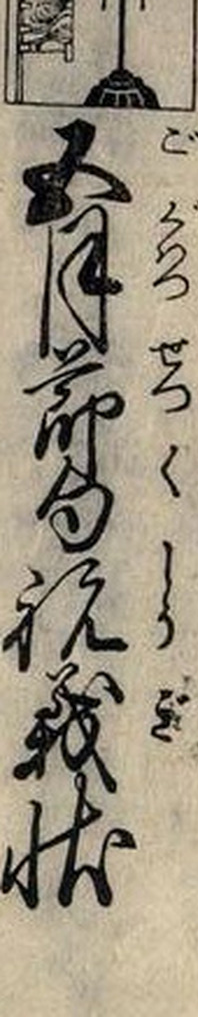五月節句祝義状
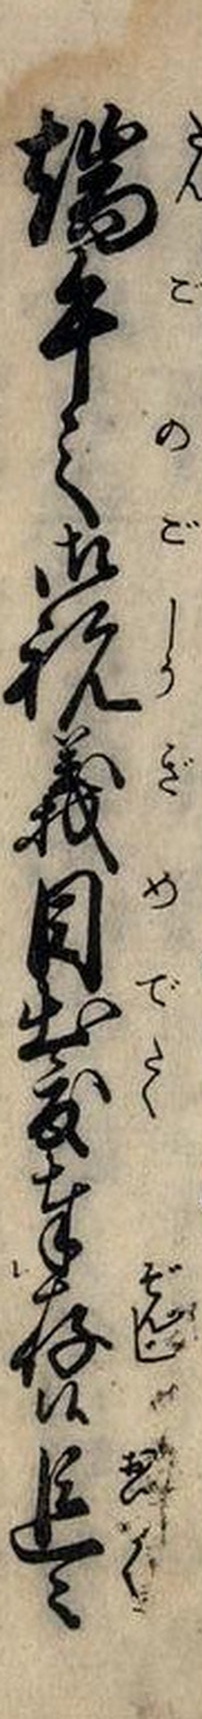端午之御祝義目出度奉存候追々
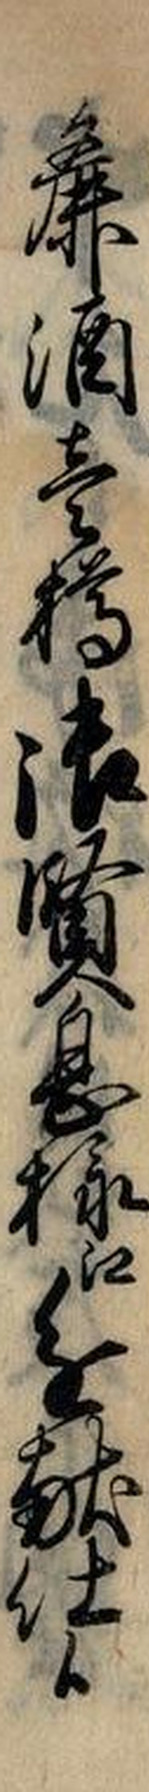麁酒壱樽御賢息様江進献仕候
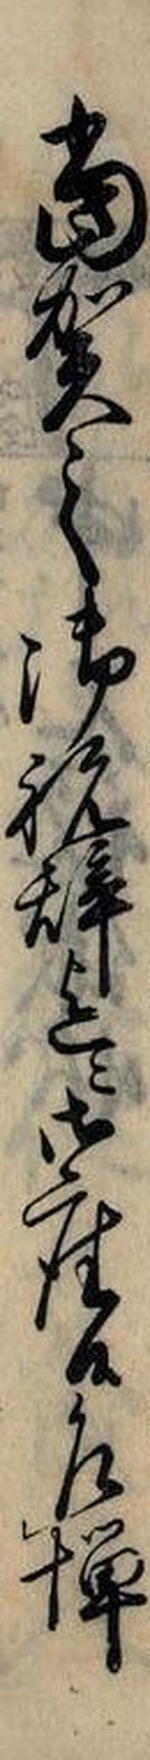當賀之御祝辞迄に御座候乍憚
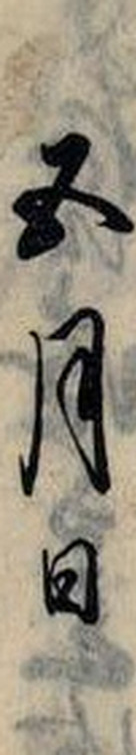五月日
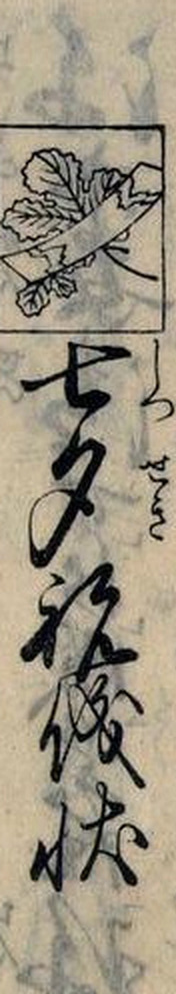七夕祝儀状
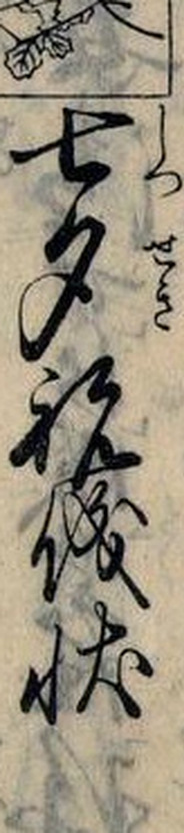七夕祝儀状

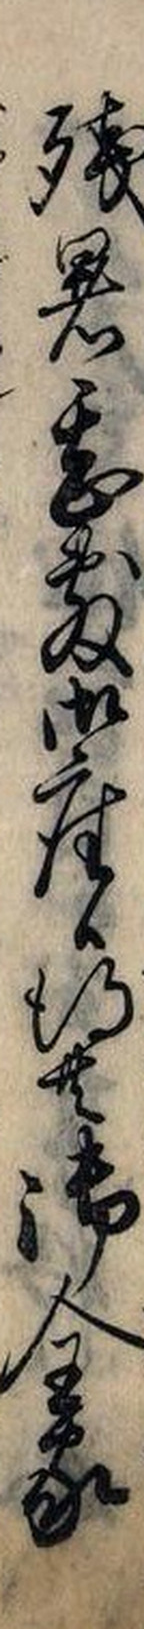残暑甚敷御座候得共御全家
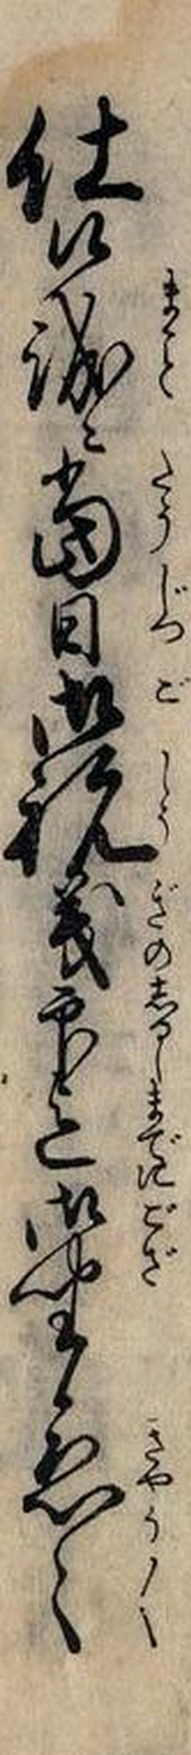仕候誠に當日御祝義印迄御座候恐々
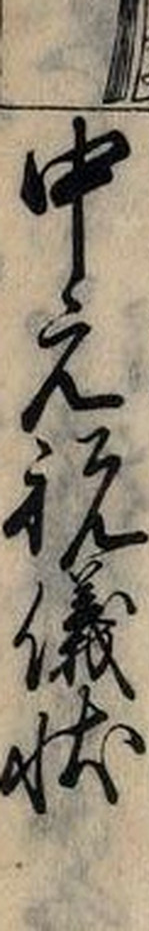中元祝儀状
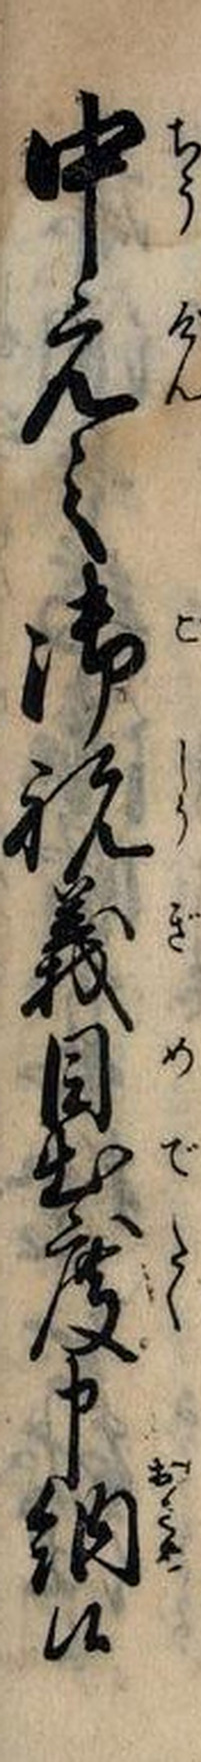中元之御祝義目出度申納候

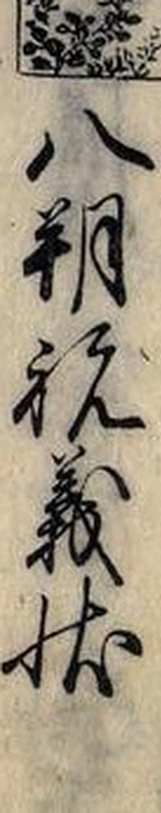八朔祝義状
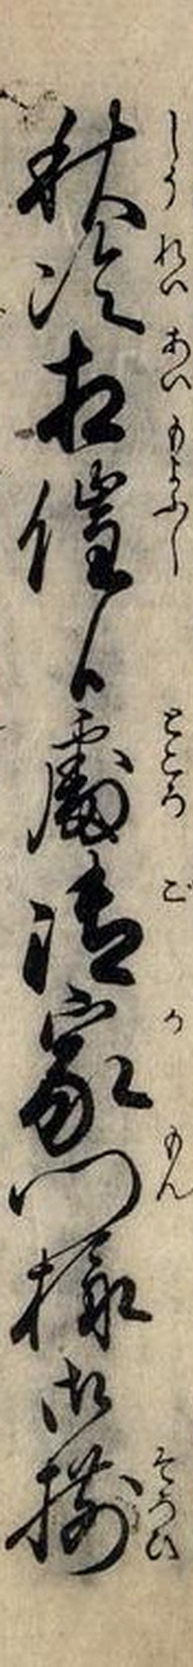秋冷相催候處御家門様御揃
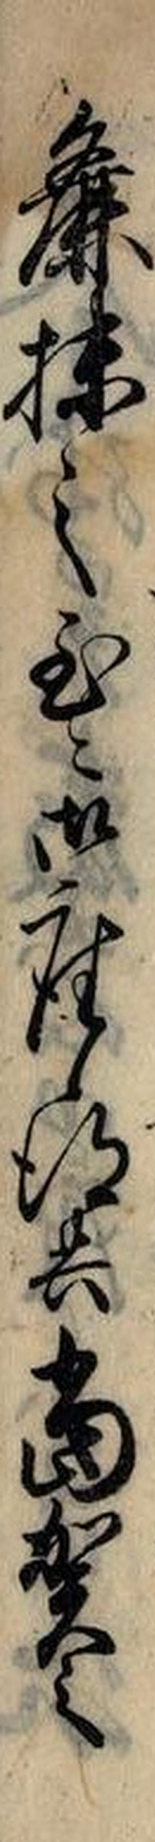麁抹之至に御座候得共當賀之
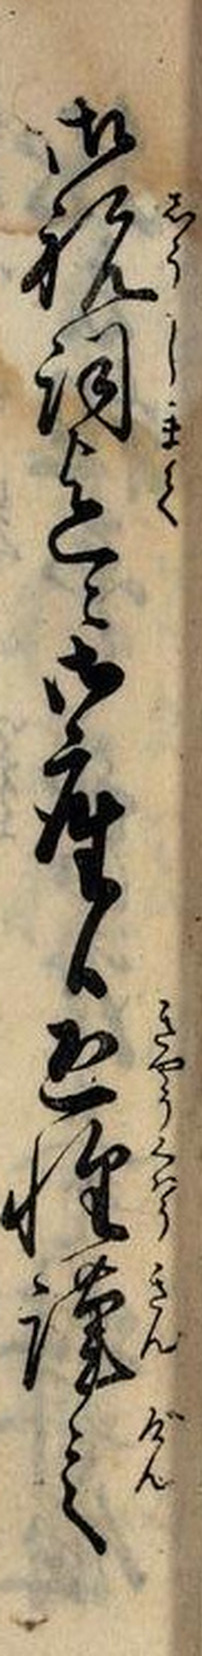御祝詞迄に御座候恐惶謹言
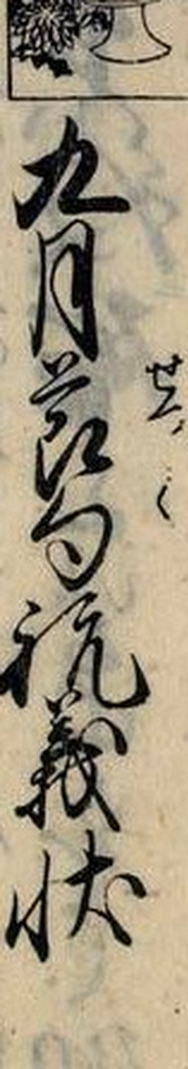九月節句祝義状
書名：大成用文章（往来物）
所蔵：福井県文書館 Fukui Prefectural Archives
